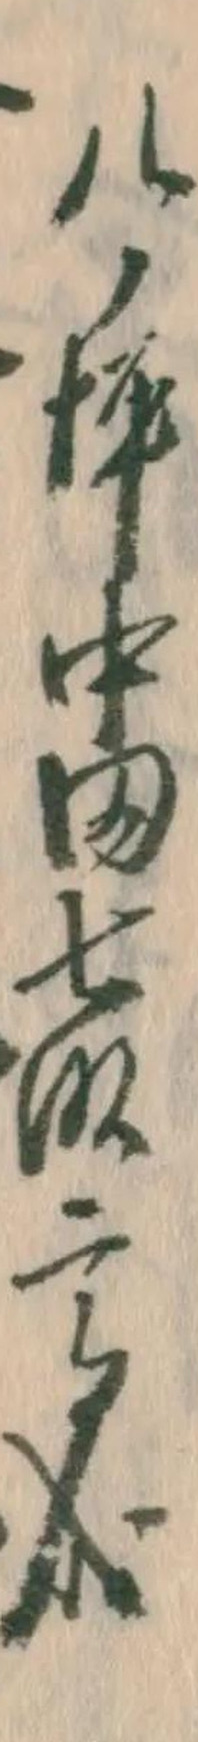八ノ坪中田七畝高
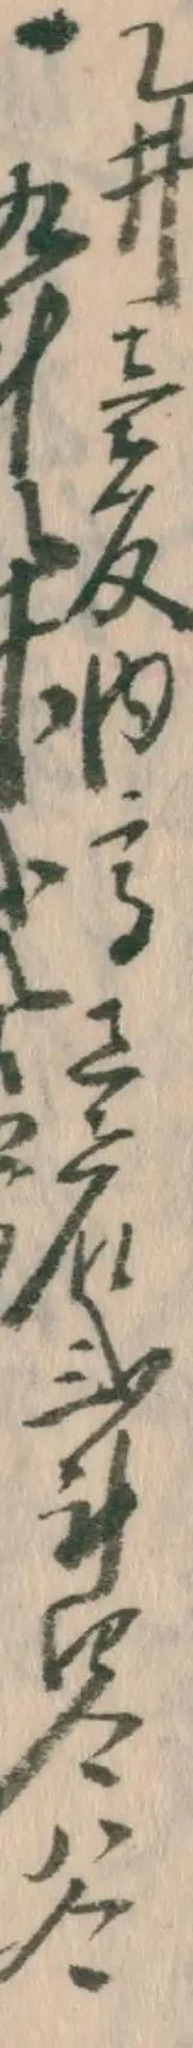乙井壱反内高壱石弐斗四合八勺
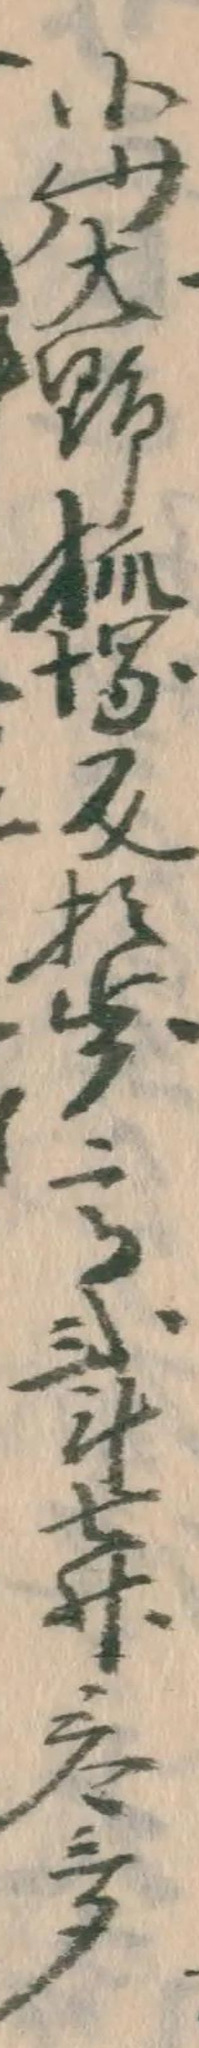小山大野狐塚反拾歩高弐斗七升三合三勺
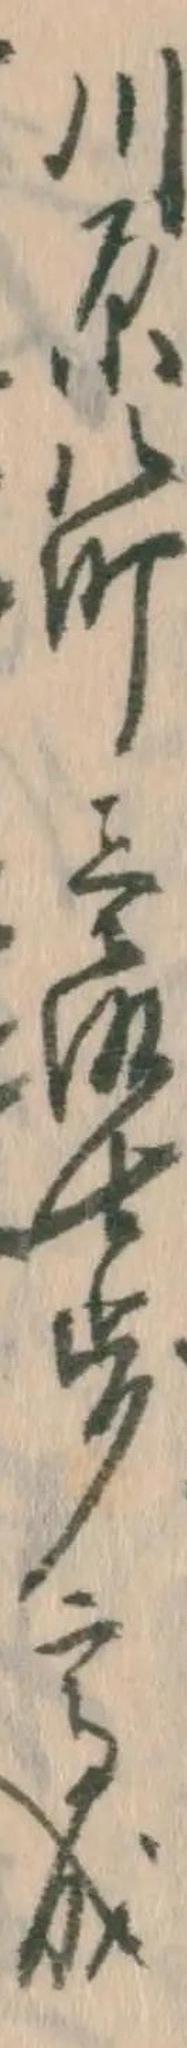川原八町壱畝七歩高成
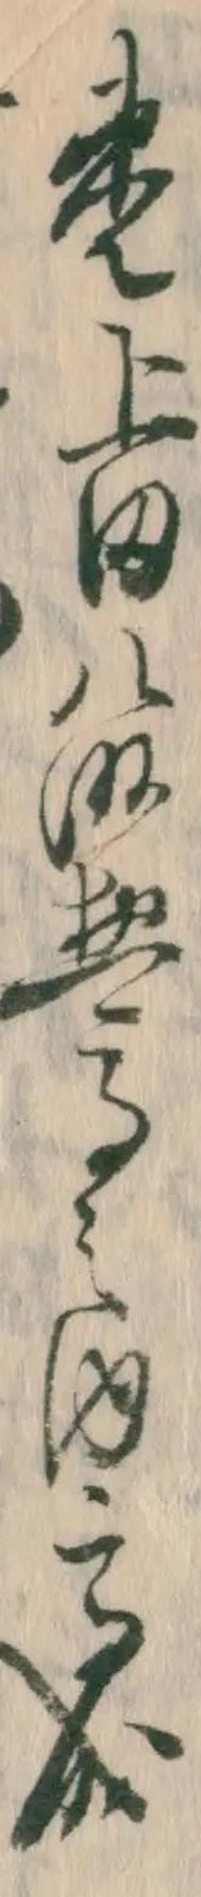東ノ上田八畝惣高之内高成
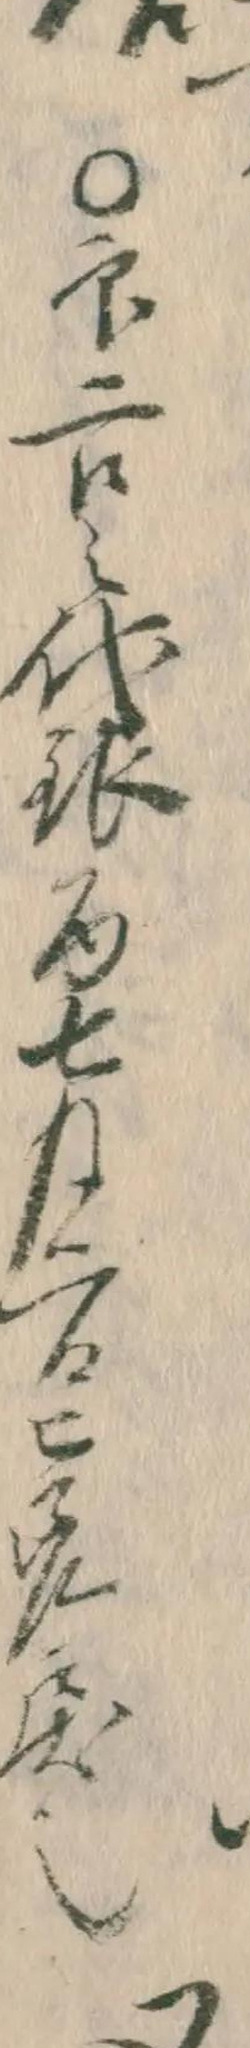○印二日之代銀酉七月二日被差戻之
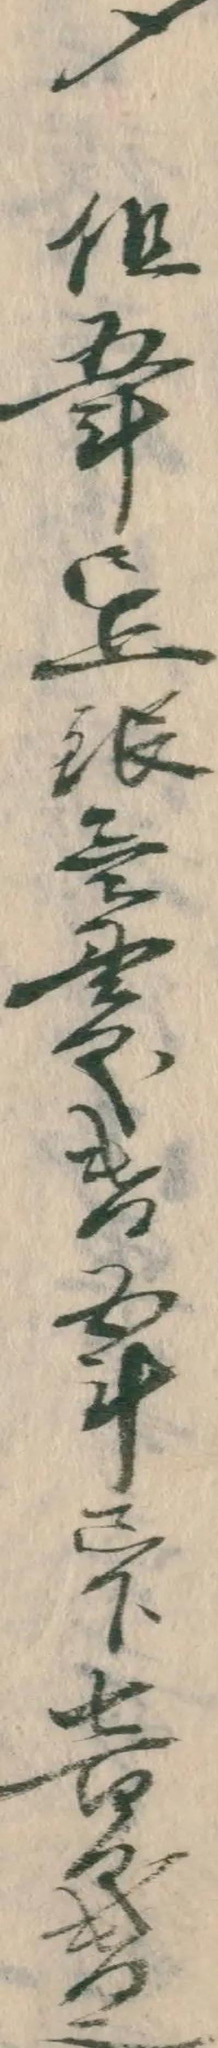〆但五斗已上銀壱貫匁者五斗已下七百匁弐者也
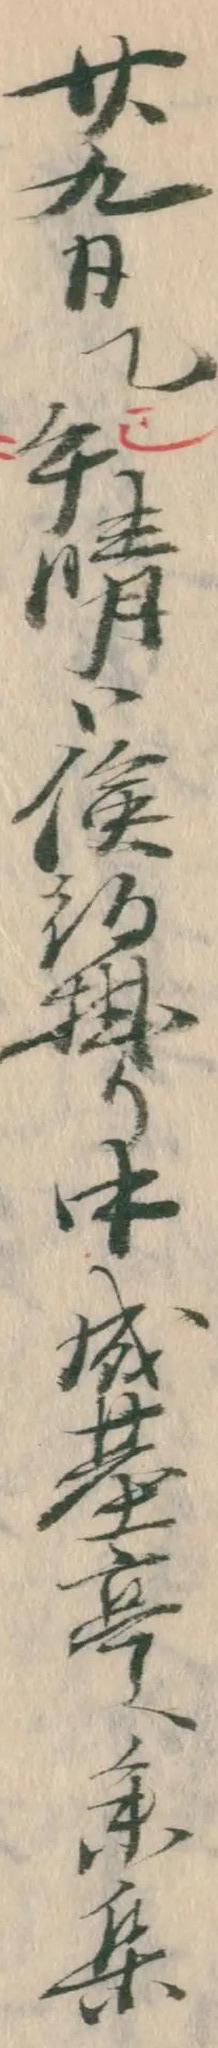廿九日乙午晴御倹約掛り中成基亭へ参集
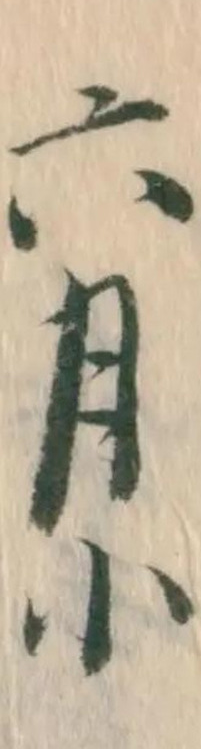六月小
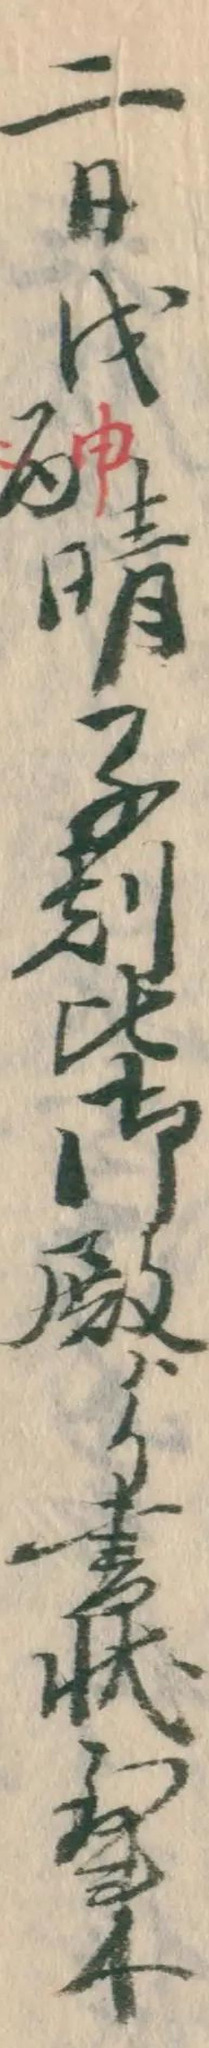二日戊酉晴子刻比御殿より書状到来
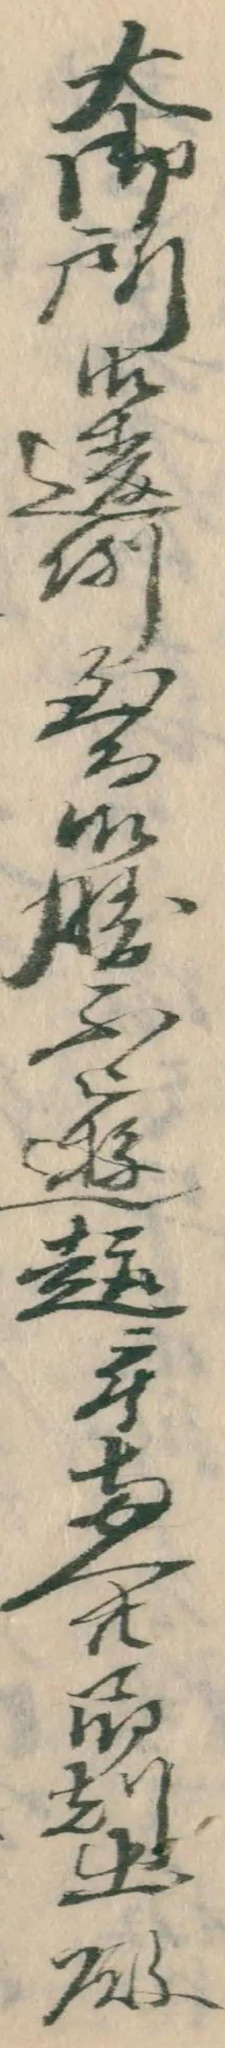大御所御違例至而御勝不被遊趣二付両人共即刻出殿
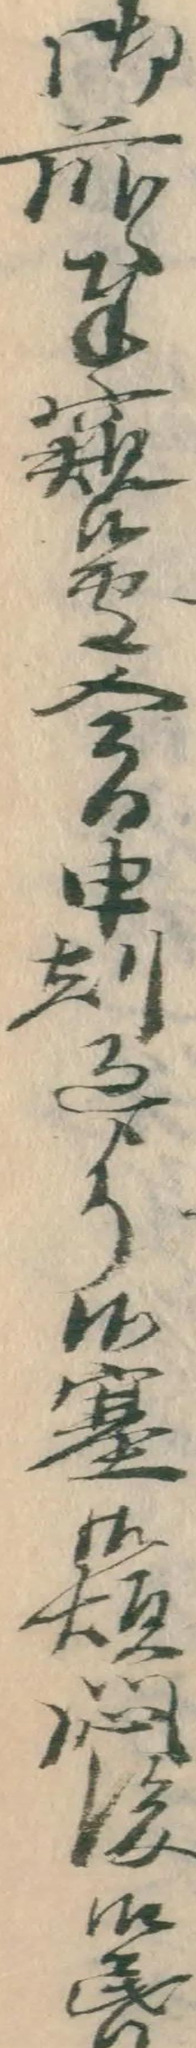御前へ奉窺候處今日申刻過より御塞御煩悶後御昏

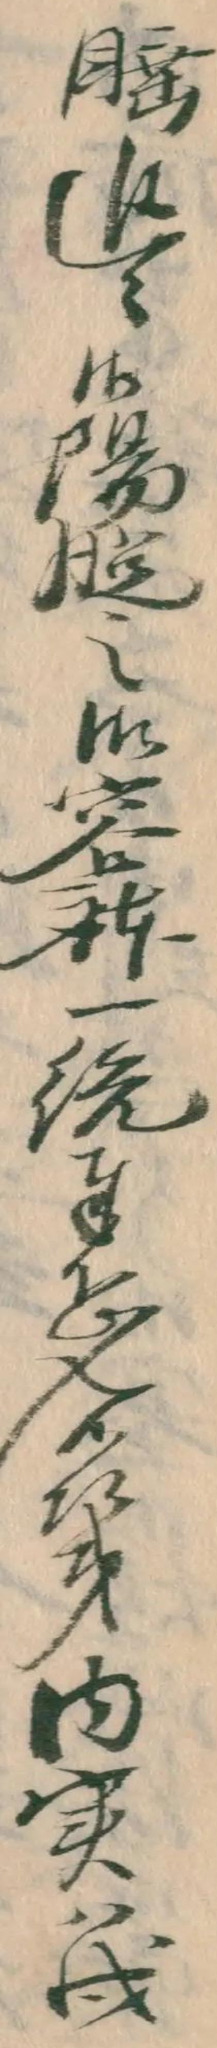睡追々御陽脱之御容躰一統奉恐入候次第内実ハ戌
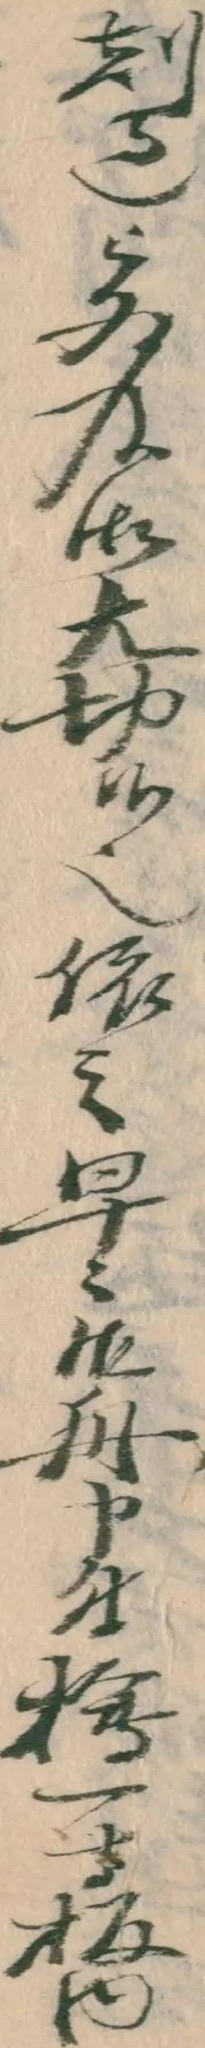刻過被為及御大切候也依之早々御舟申付檜一寸板内
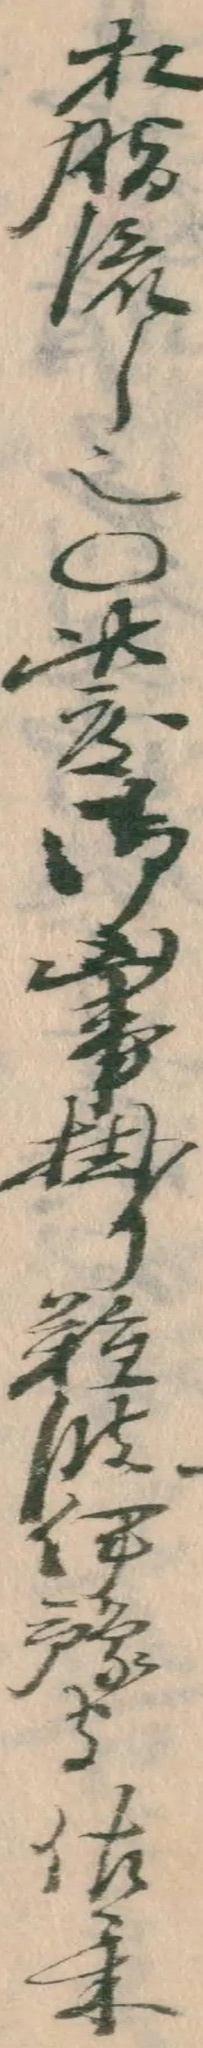松脂流し也○此度御凶事掛り難波伊豫守佐々木
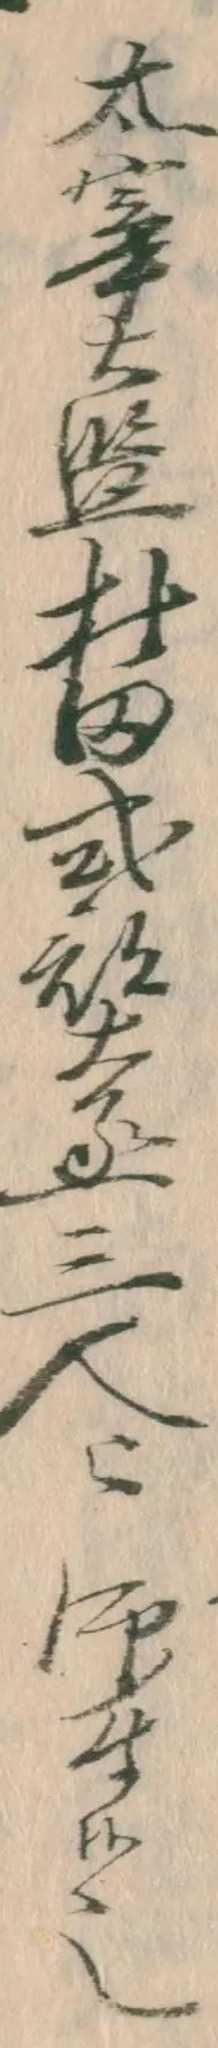太宰大監村田式部大丞三人被仰付候也
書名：賀茂社記録. 第67冊
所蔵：国立国会図書館 National Diet Library, JAPAN
